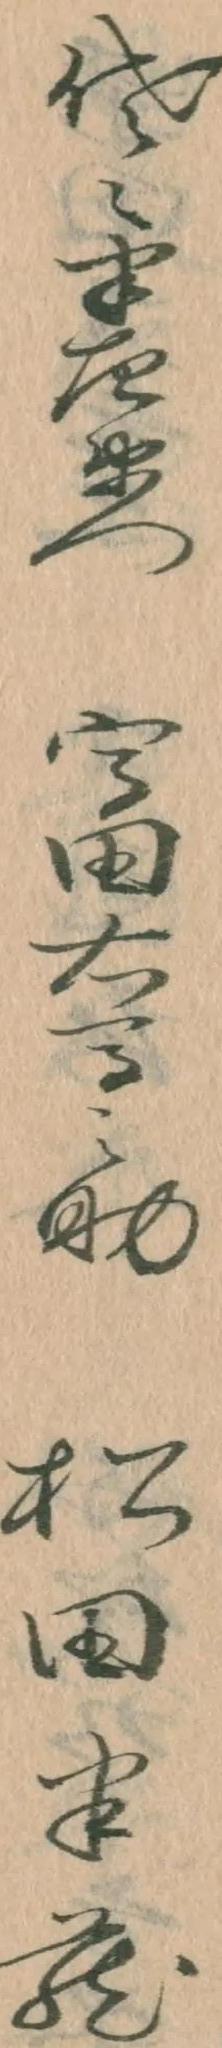佐々半左衛門宇田右馬之助松田半蔵
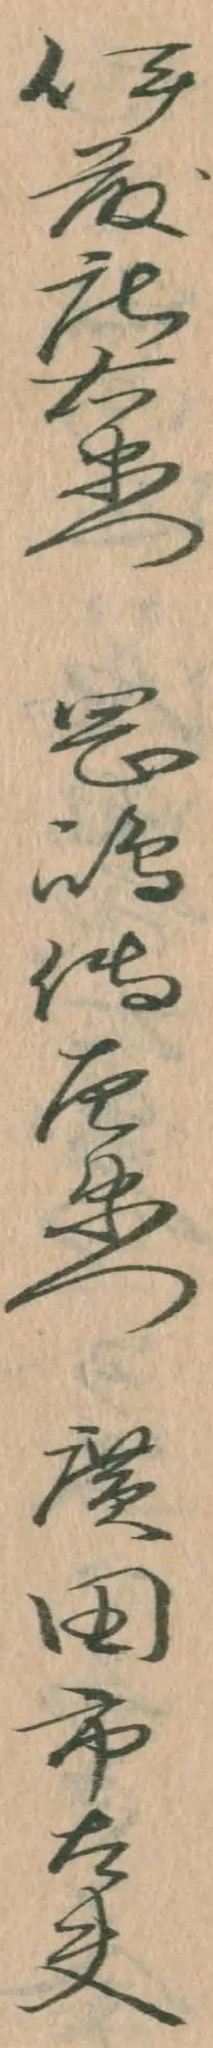伊藤庄右衛門岡島伝左衛門廣田市太夫
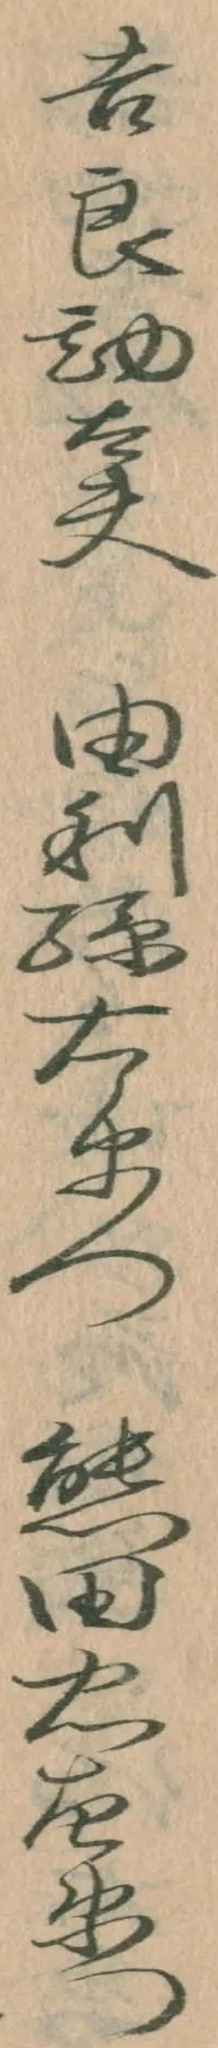吉良勘太夫由利孫右衛門熊田忠左衛門
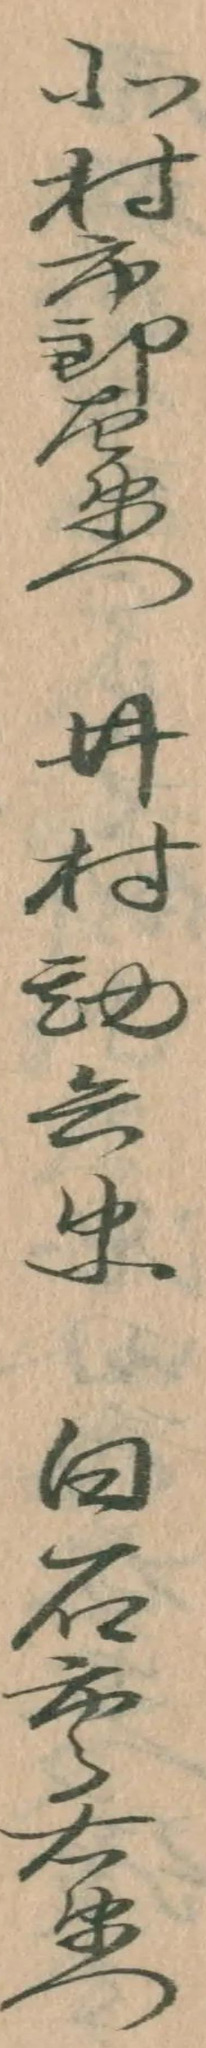北村市郎左衛門井村干兵衛白石市郎右衛門
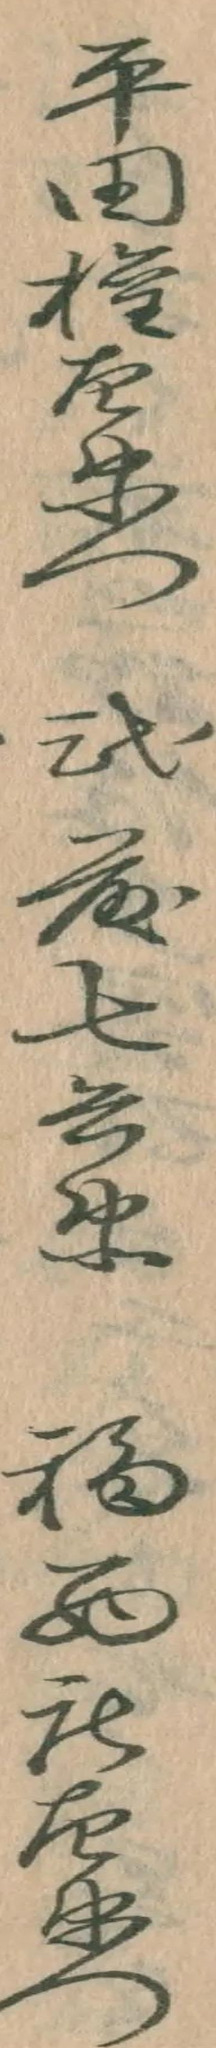平田権左衛門武藤七兵衛福西庄左衛門
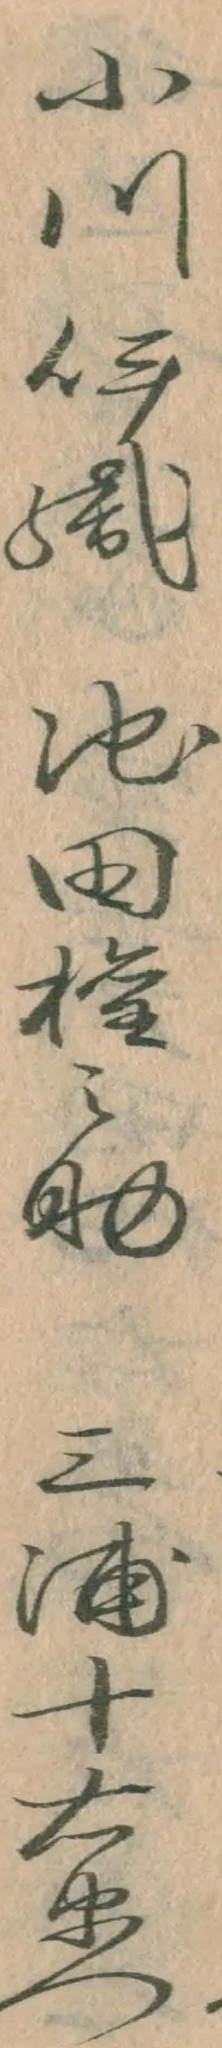小川伊織池田権之助三浦十右衛門
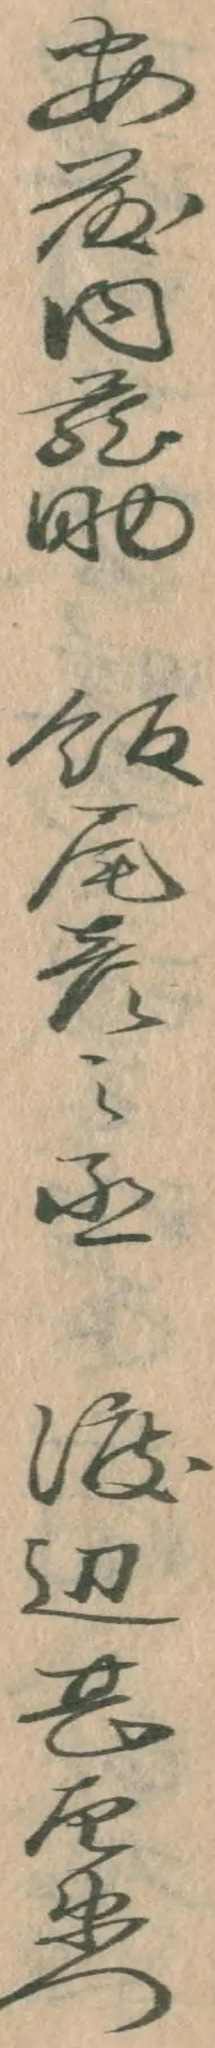安藤内蔵助飯尾彦之丞渡辺仁左衛門
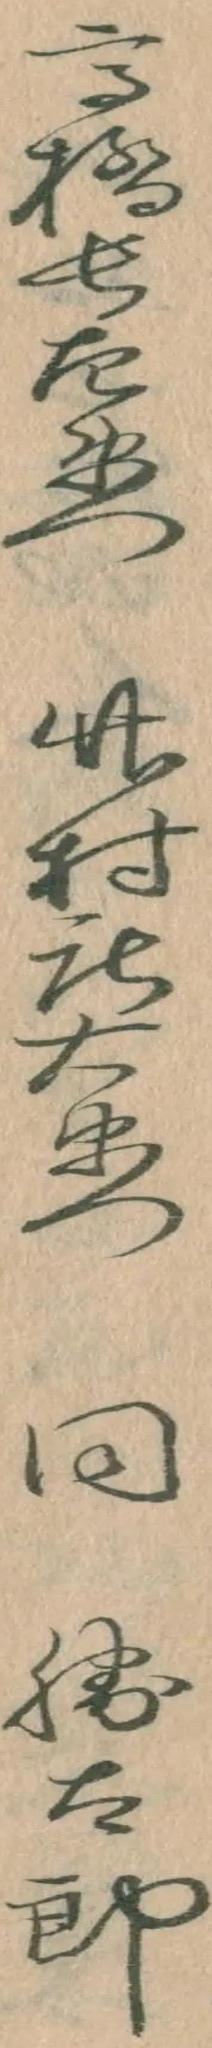高橋長左衛門竹村庄右衛門同勝太郎
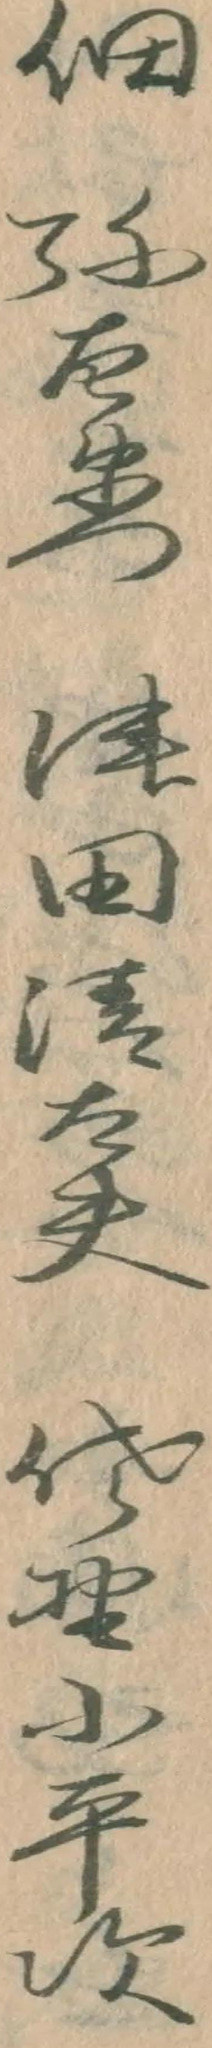佃弥左衛門津田清太夫佐野小平次
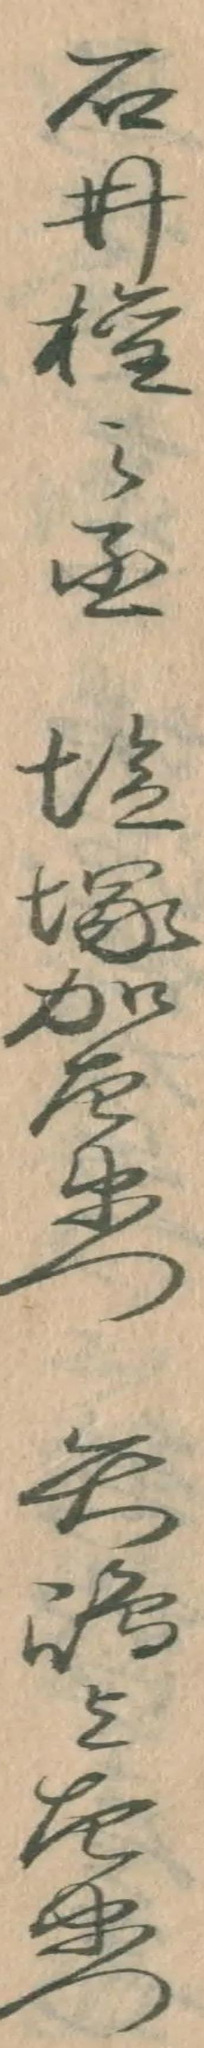石井権之丞塩塚加左衛門矢島与左衛門
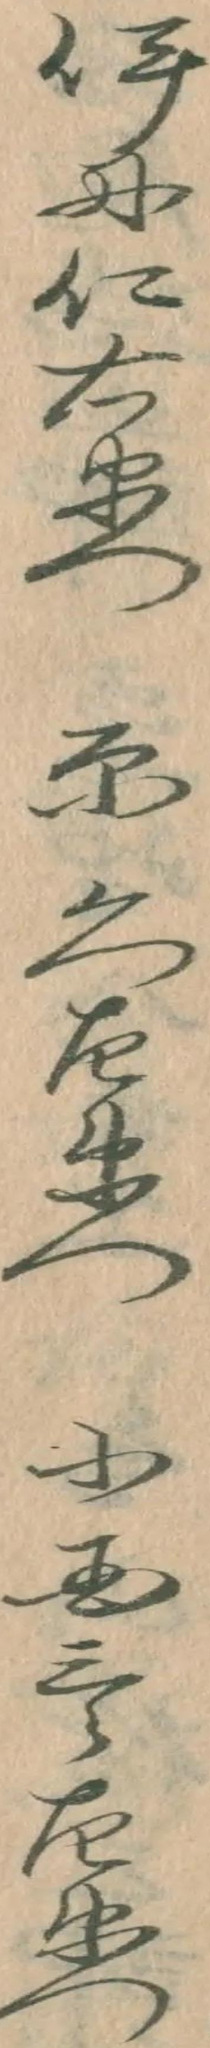伊丹仁右衛門原久左衛門小国三郎左衛門

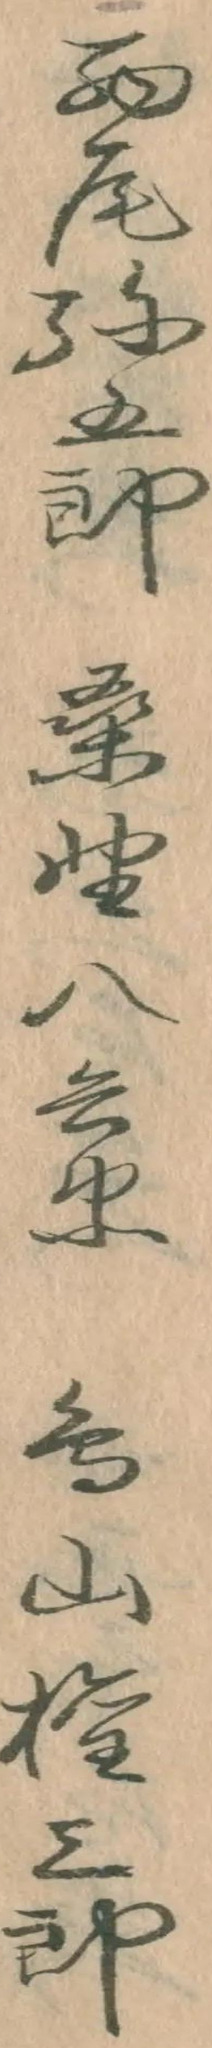西尾弥五郎桑野八兵衛鳥山権三郎
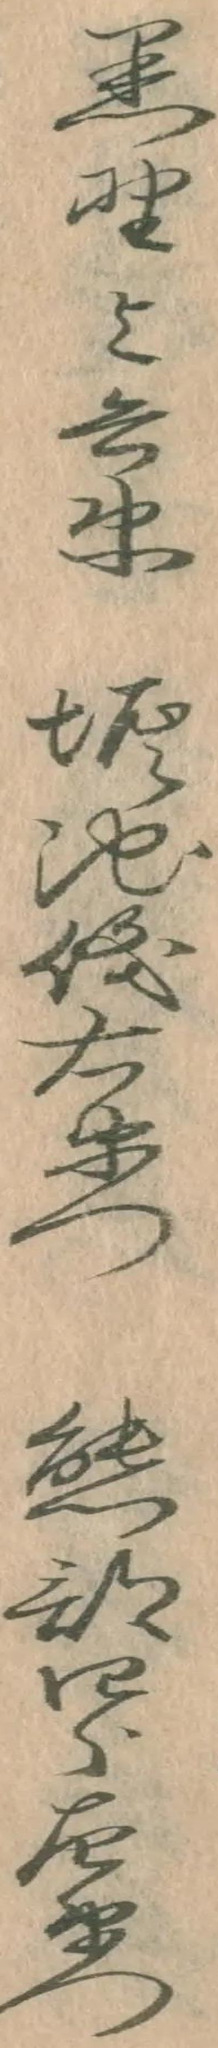黒野与兵衛堀池儀右衛門熊部四郎左衛門
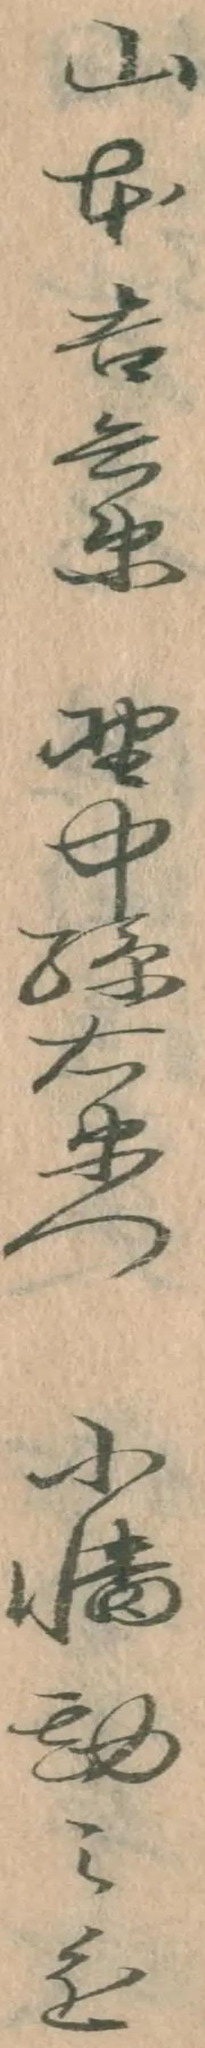山本吉兵衛野中孫右衛門小幡勘之進
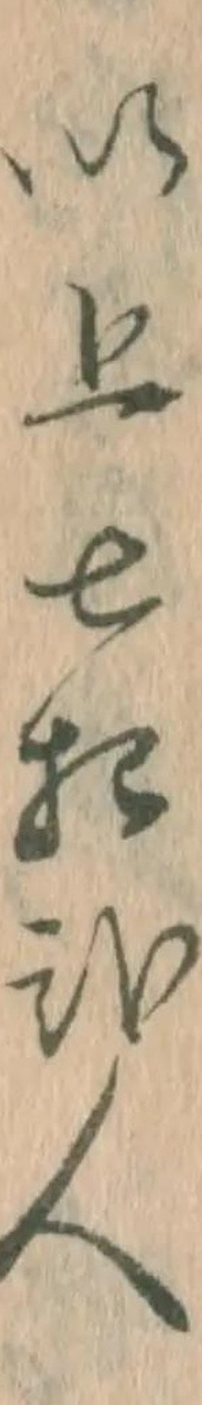以上七拾弐人
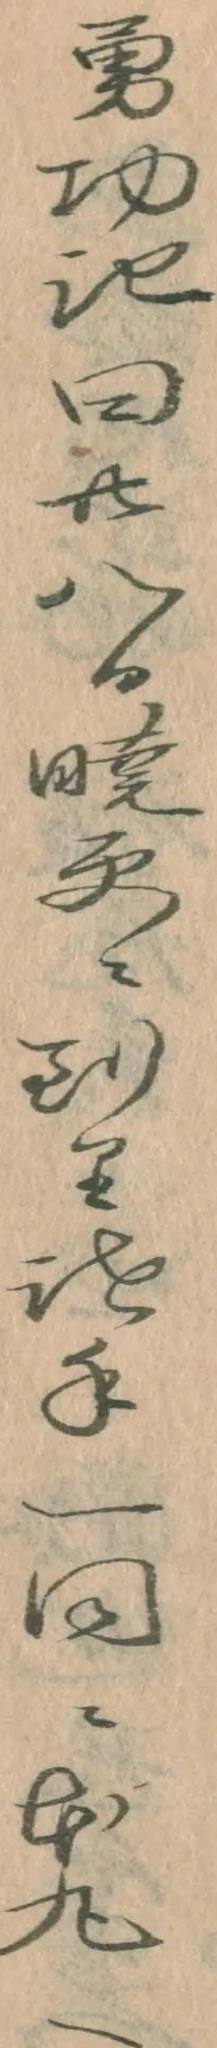勇功記曰廿八日暁天に到里諸手一同に本丸へ
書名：切支丹御退治記 49巻. [9]
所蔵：国立国会図書館 National Diet Library, JAPAN
